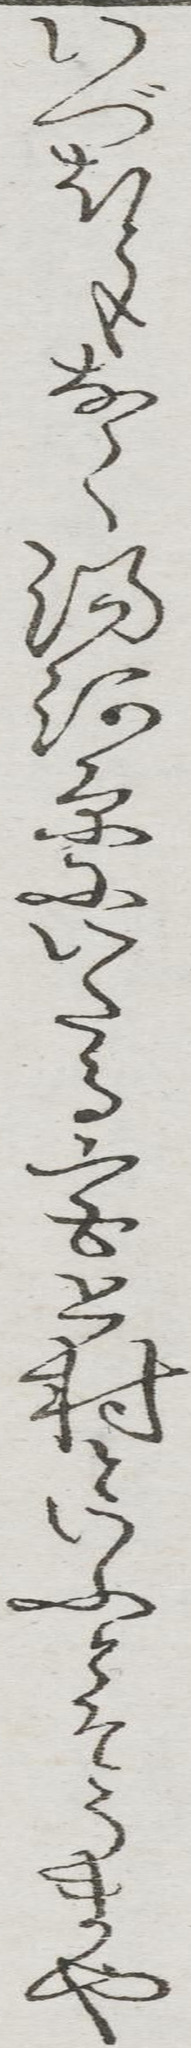いづほともなく湯河原にいたる宮上村といふとそうまや
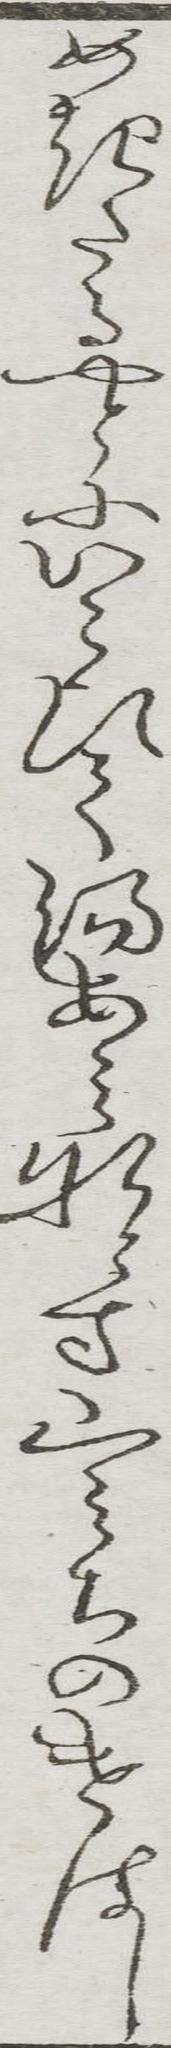めきたるやとにいこひて湯あみなとす山みちのけはし
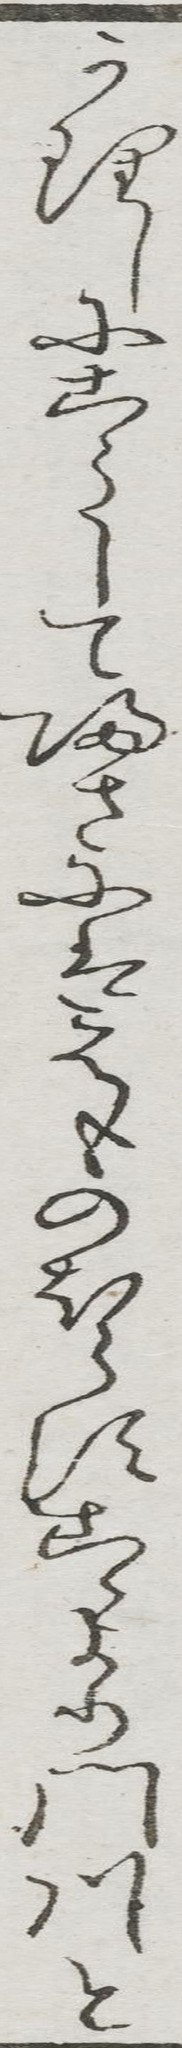かりしにこうして帰さにはえものほらすこゝより門川と
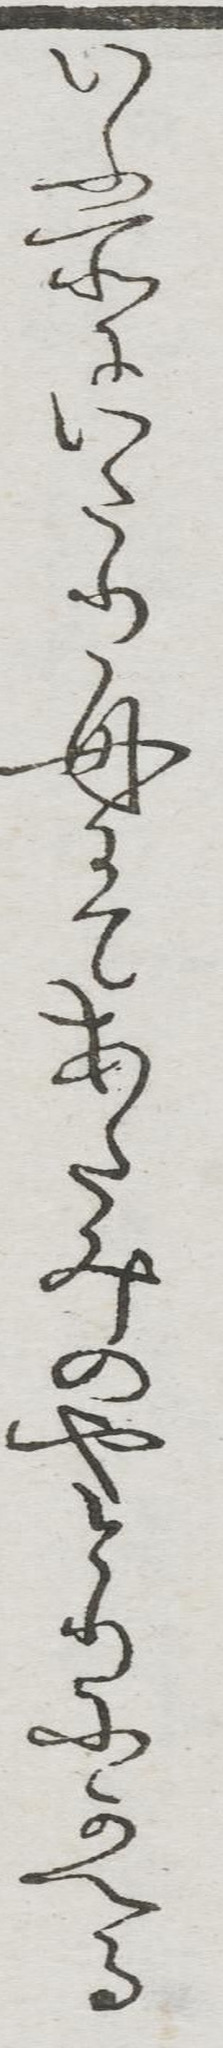いふ所にいたり舟にてあたみのやとりにかへる
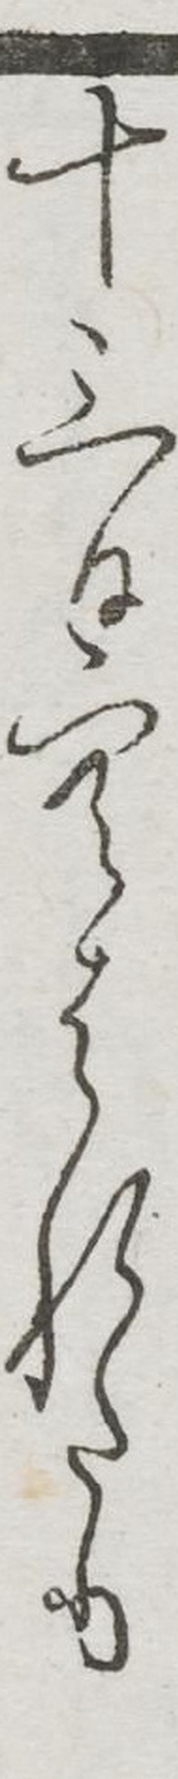十三日空はれたり
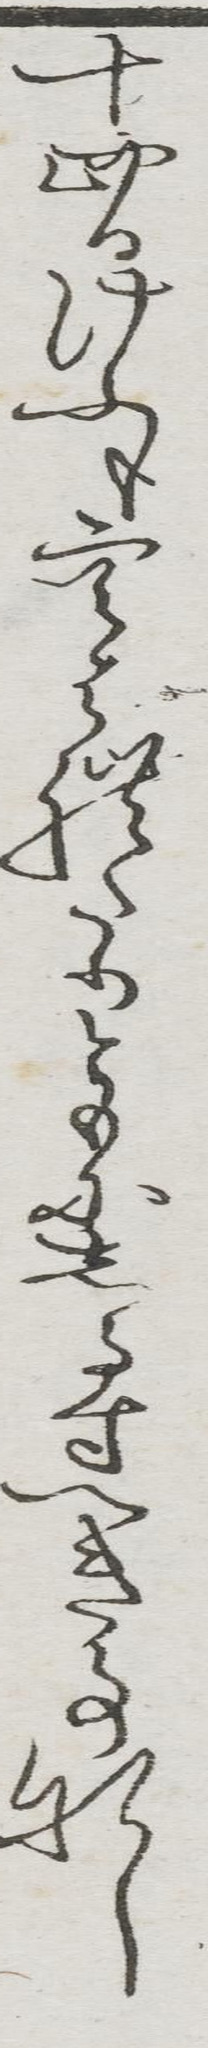十四日けふも空はりたりともにしるすへき事なし
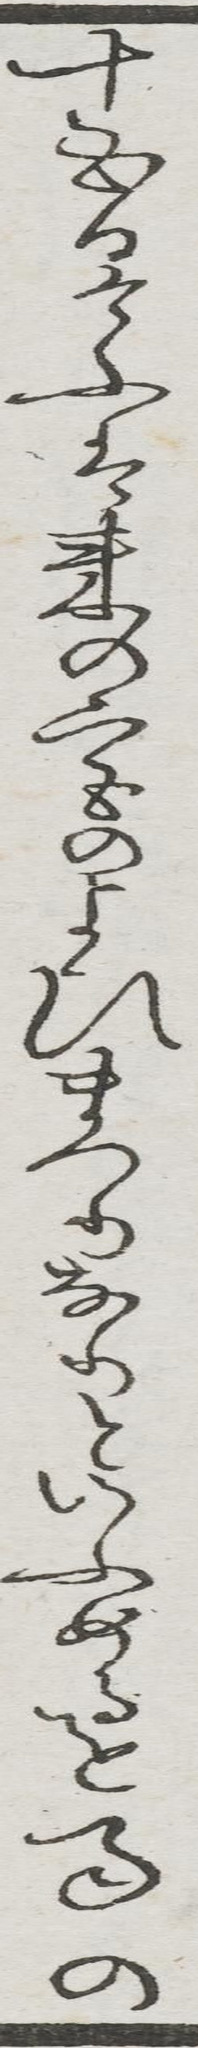十五日けふは来の宮のよひまつりなりといふめるを雨の
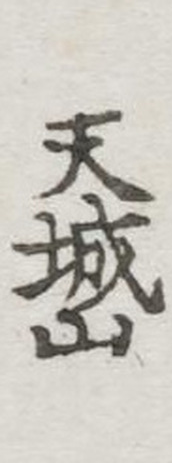天城山
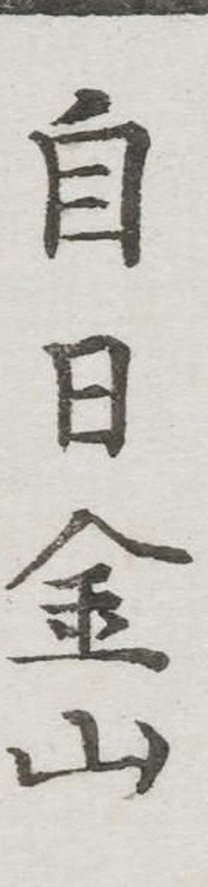自日金山
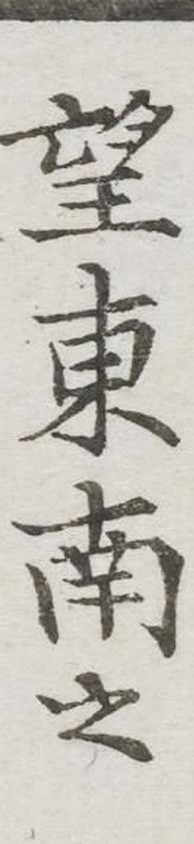望東南之
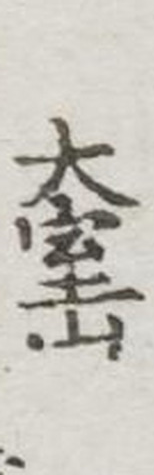大室山

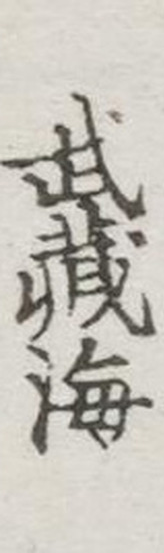武蔵海
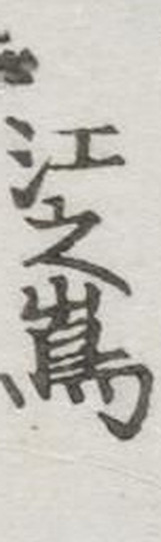江之嶌

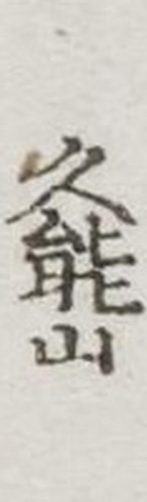久能山
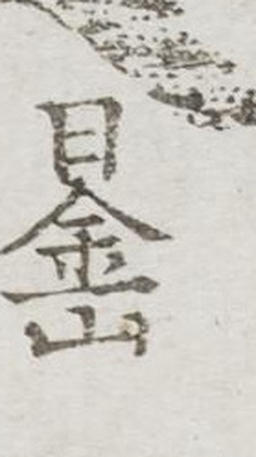日金山

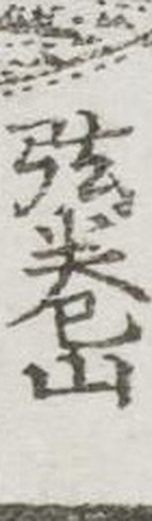弦巻山
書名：挿画熱海日記　全
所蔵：東京大学地震研究所図書室 Earthquake Research Institute Library, The University of Tokyo, JAPAN
